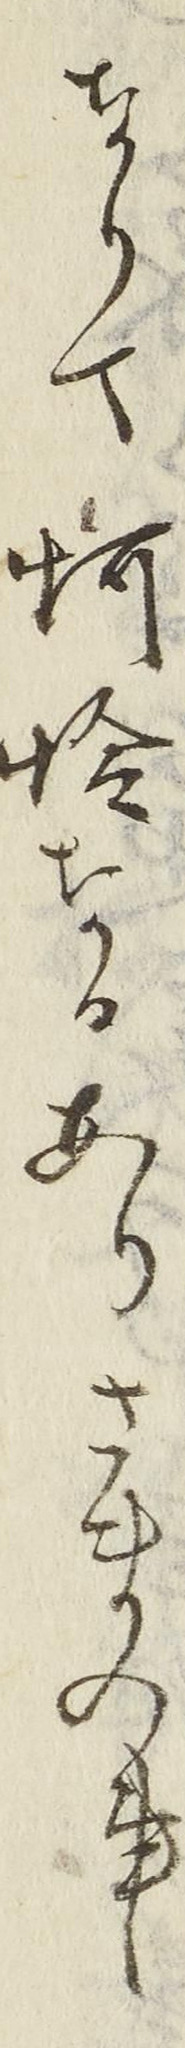なりて怐怜なるありさまの事
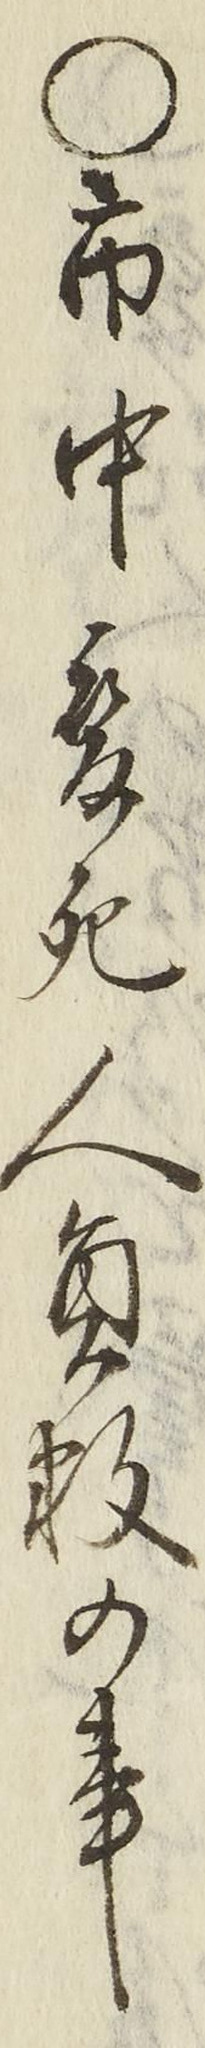〇市中変死人員数の事
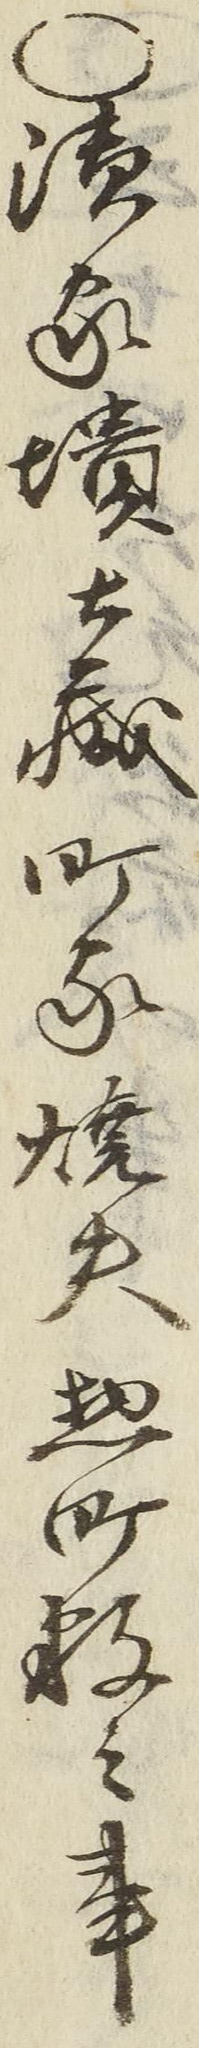〇潰家墤土蔵町家焼失惣町数之事

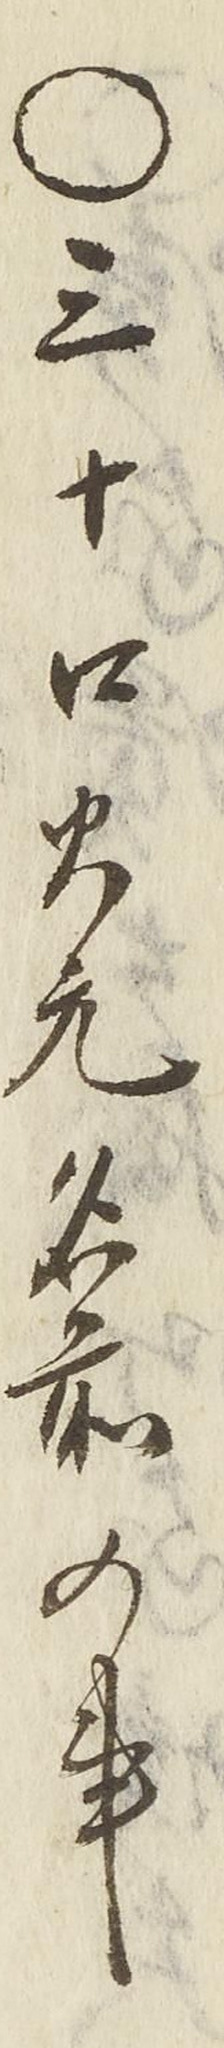〇三十口火元名前の事
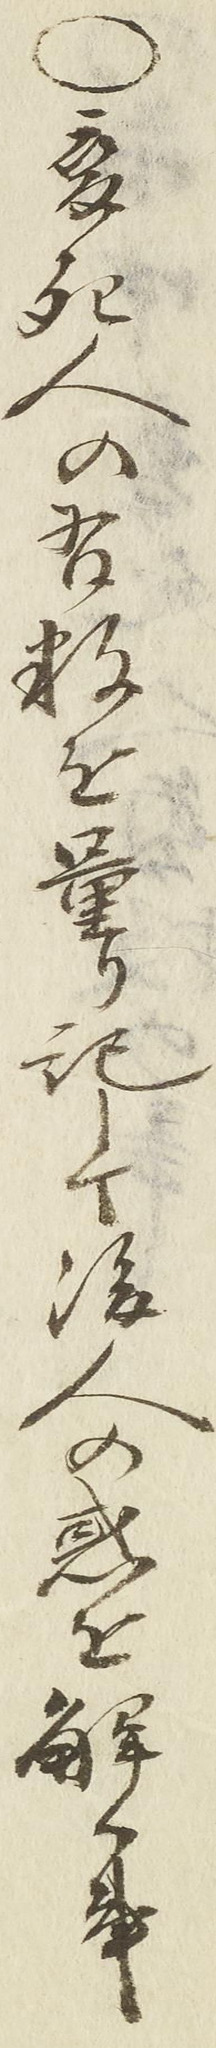〇変死人の有数を量り記して後人の惑を解く事
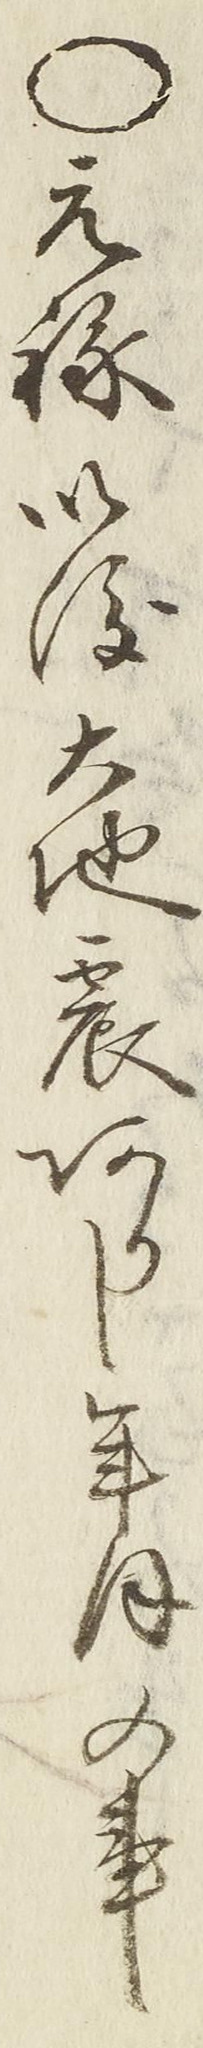〇元禄以後大地震ありし年月の事
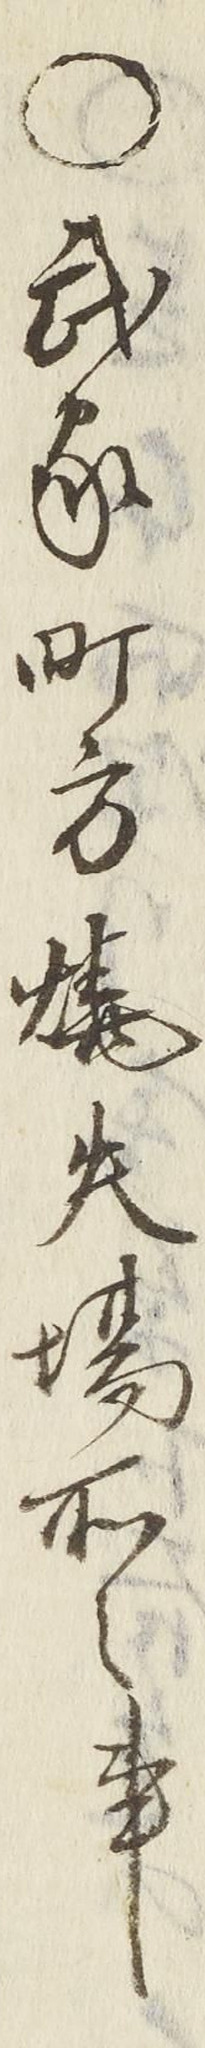〇武家町方焼失場所之事
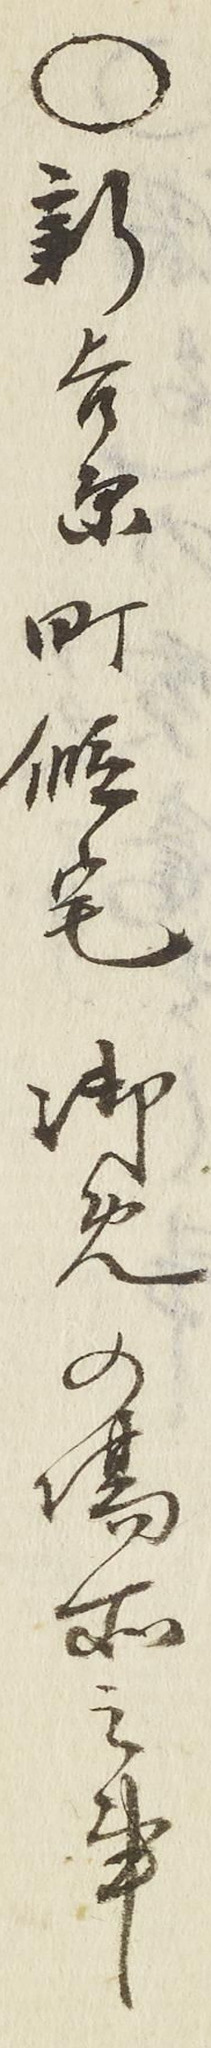〇新吉原町假宅御免の場所之事
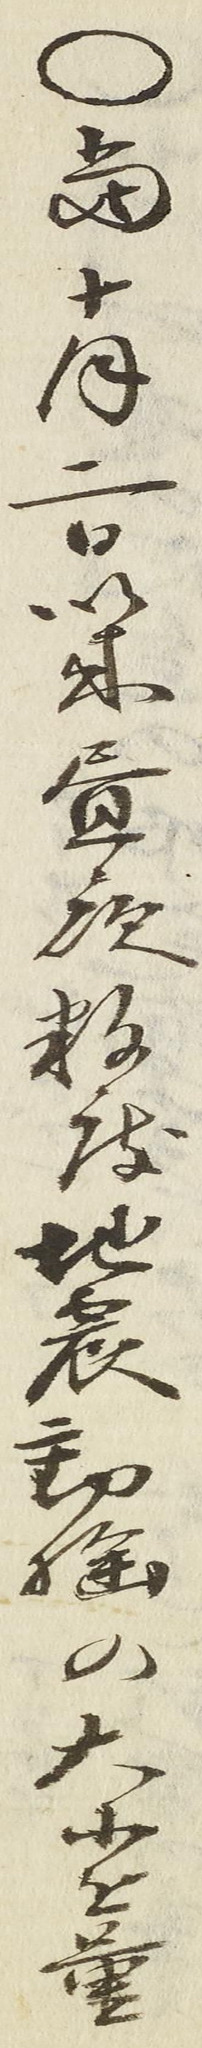〇当十月二日以来昼夜数度地震動揺の大小を量
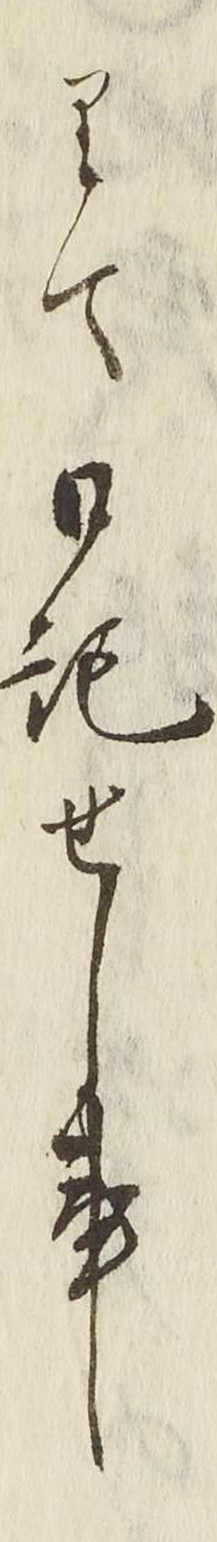りて日記せし事
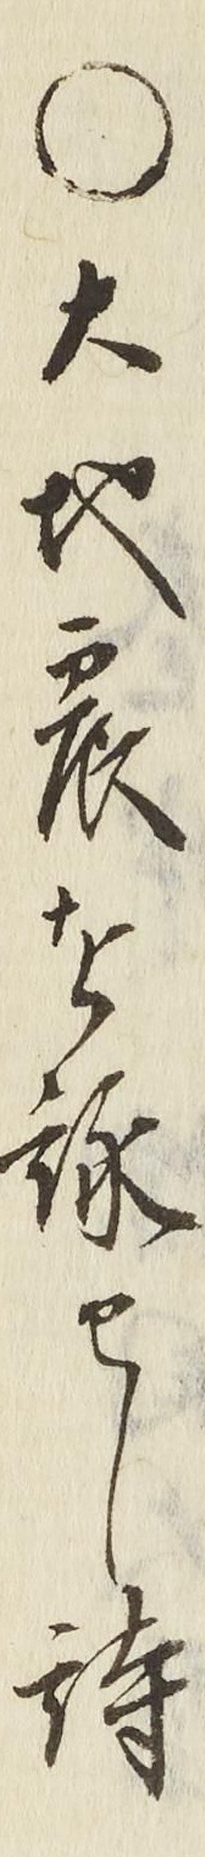〇大地震を詠せし詩
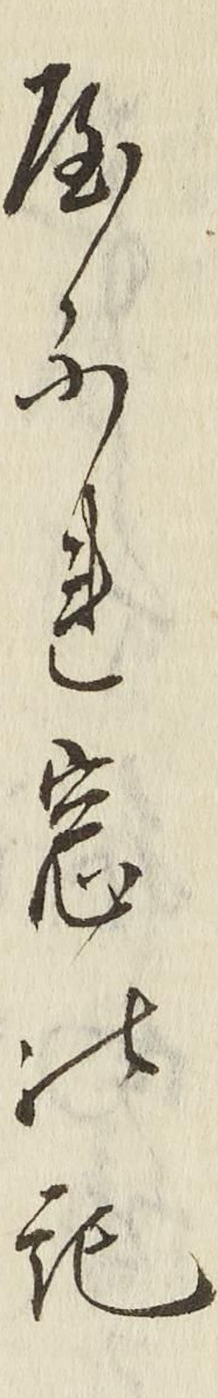やふれ窓の記
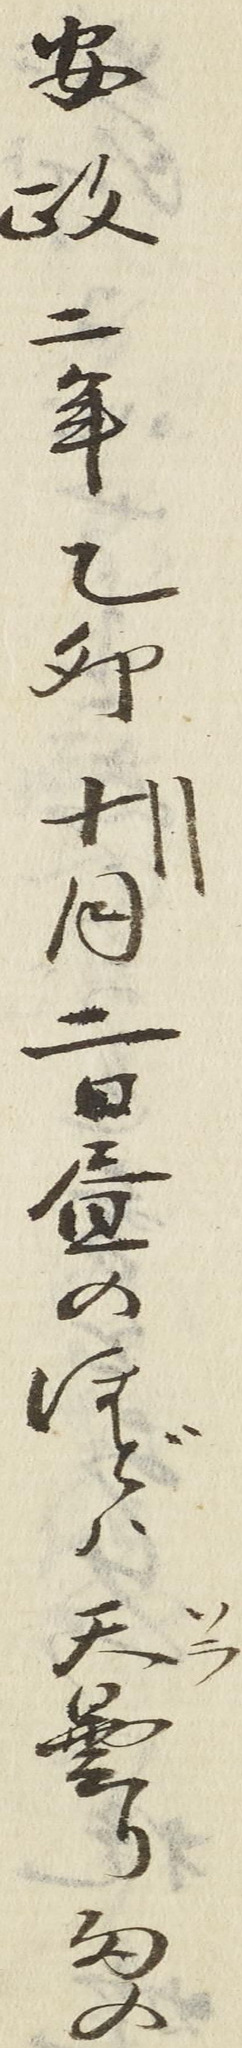安政二年乙夘十月二日昼のほどは天曇り雨の
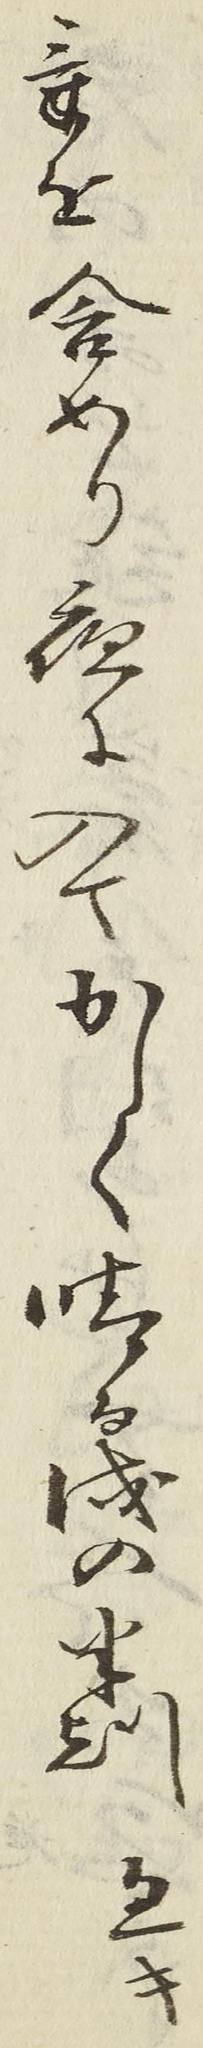気を含めり夜に入て少しく晴る戌の半刻過き
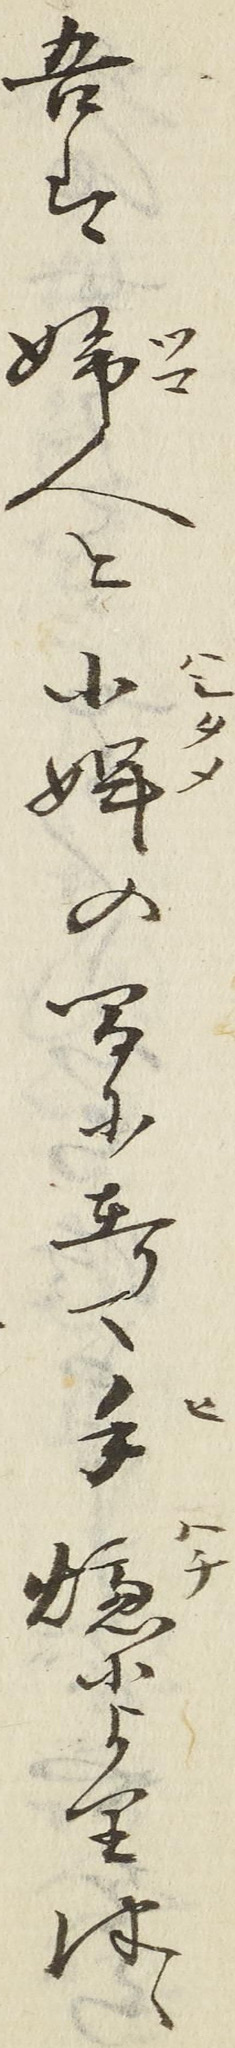吾は婦人と小婢の間に在りて手爈によりつゝ
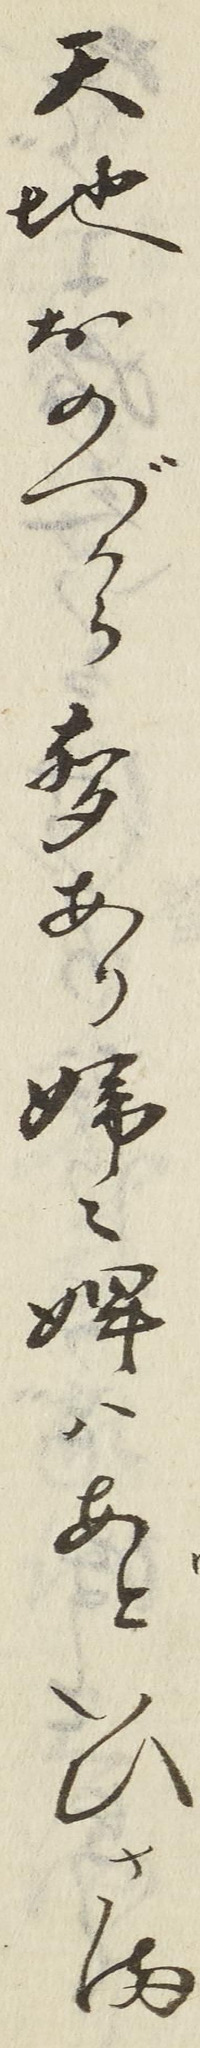天地おのづから声あり婦〻婢はあ噫といひさま
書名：やぶれ窓の記　全
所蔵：東京大学地震研究所図書室 Earthquake Research Institute Library, The University of Tokyo, JAPAN
